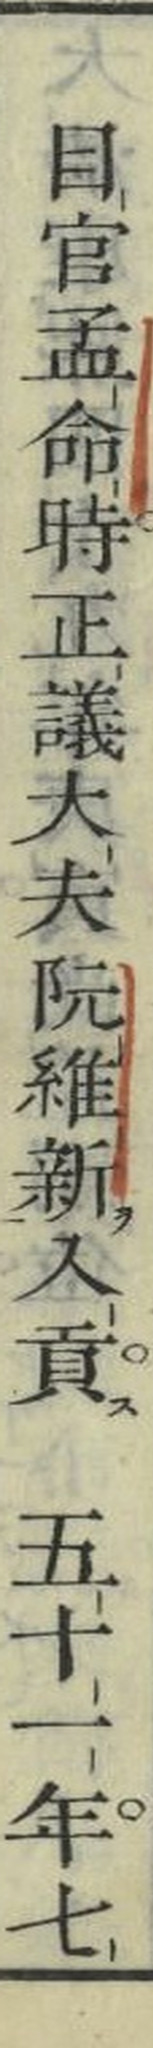目-官孟-命-時。正-議大-夫阮-維-新入-貢。五-十-一-年。七-
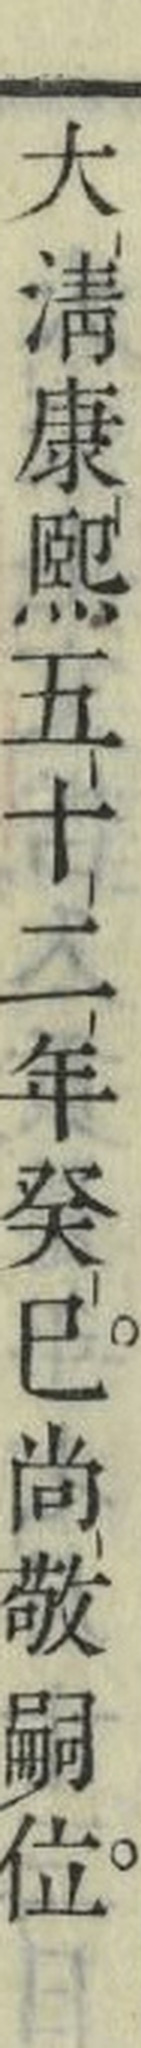大-清康-煕五-十-二-年癸-巳。尚-敬嗣位。
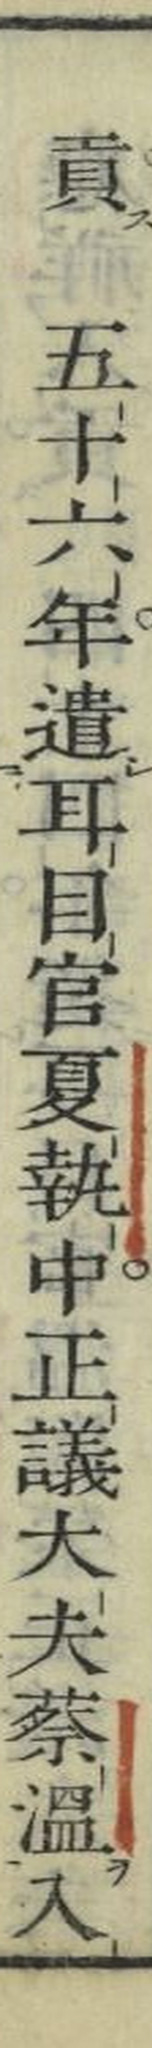貢。五-十-六-年。遣耳-目-官夏-執-中。正-議大-夫蔡-温入-

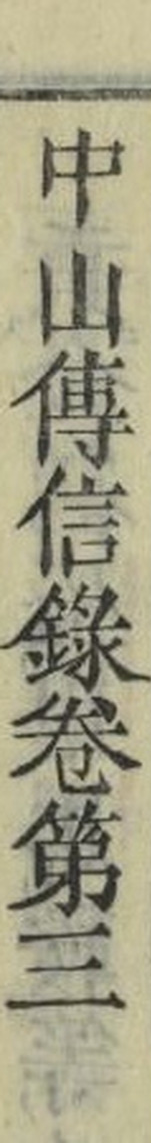中山伝信録巻第三
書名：中山伝信録 巻三
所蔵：University of the Ryukyus Library
